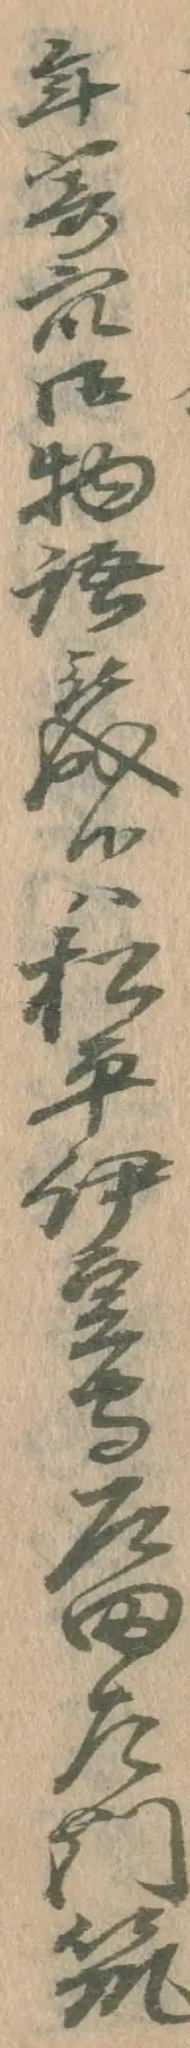年寄衆御物語被成候は松平伊豆守戸田左門筑
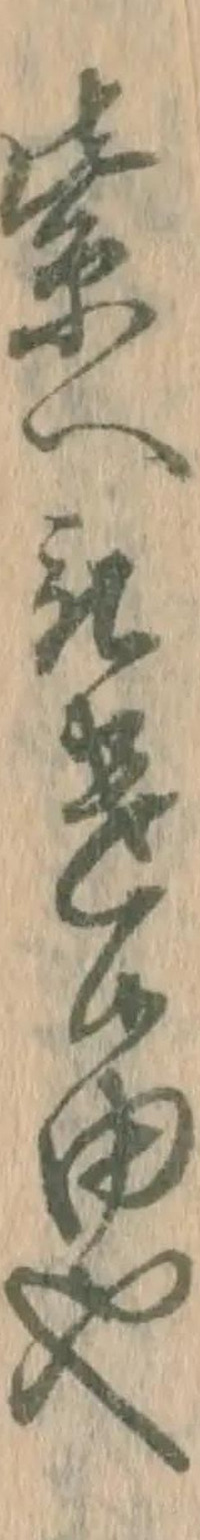紫へ被遣候由也
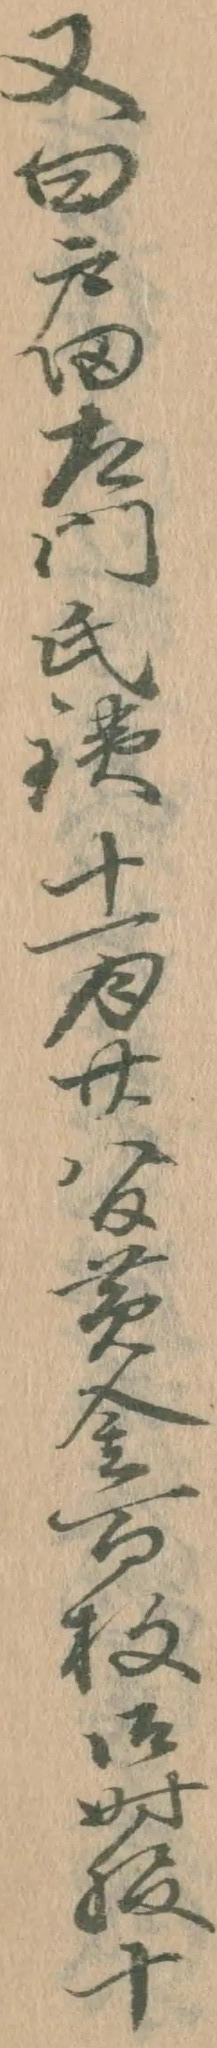又曰戸田左門氏鉄十一月廿八日黄金百枚御時服十
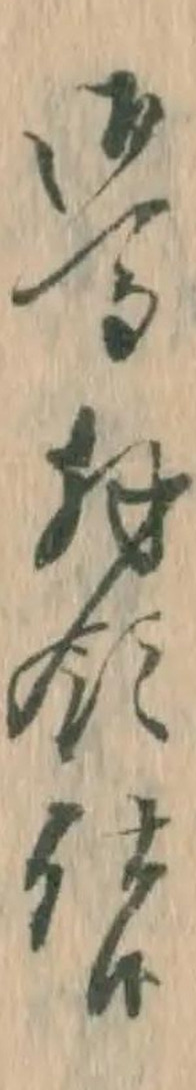御馬拝領仕候
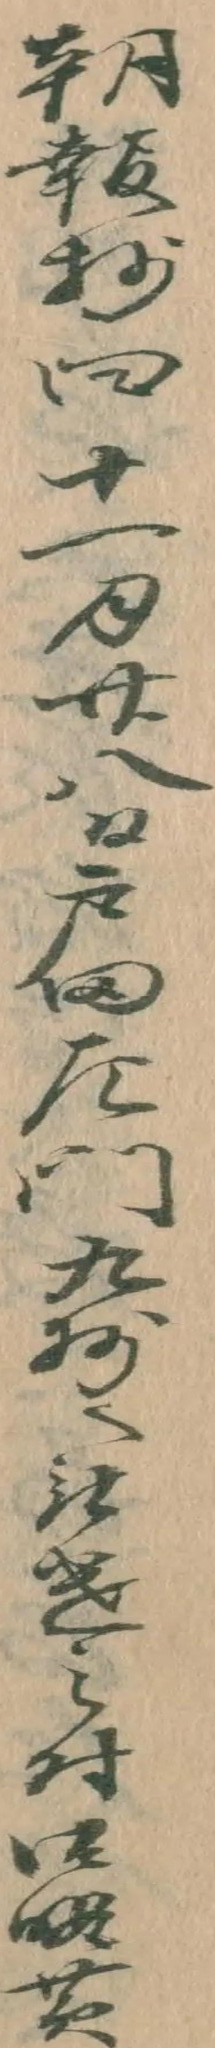朝報抄曰十一月廿八日戸田左門九州へ被遣之時御暇黄
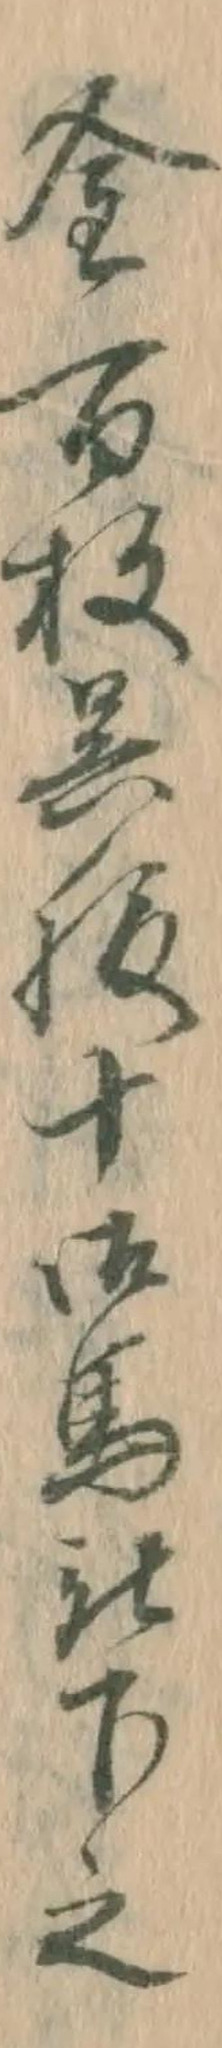金百枚呉服十御馬被下之
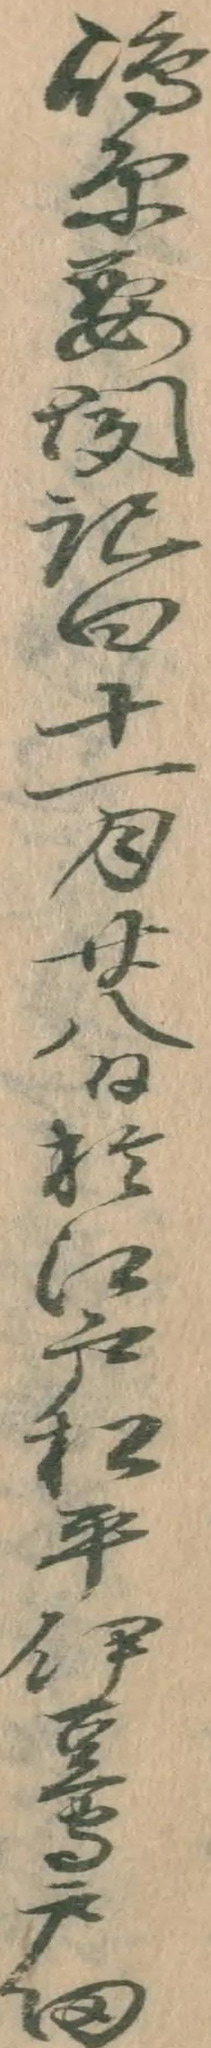島原要聞記曰十一月廿八日於江戸松平伊豆守戸田
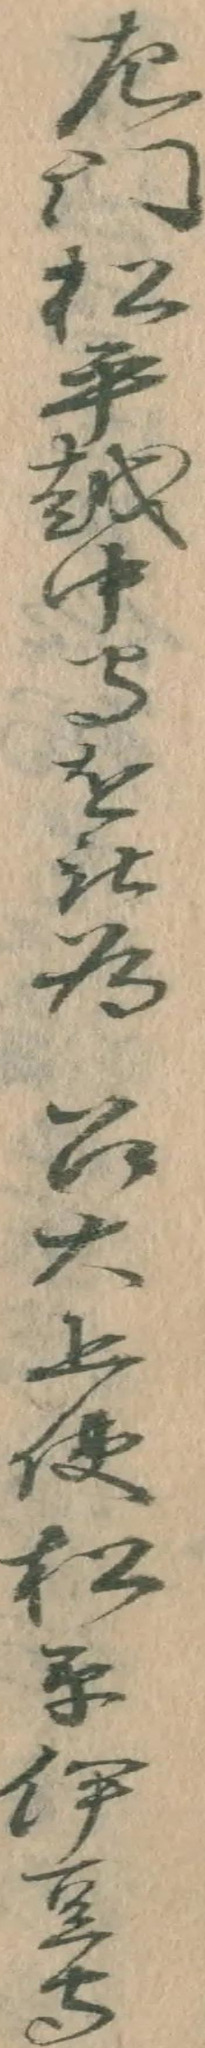左門松平越中守を被為召大上使松平伊豆守
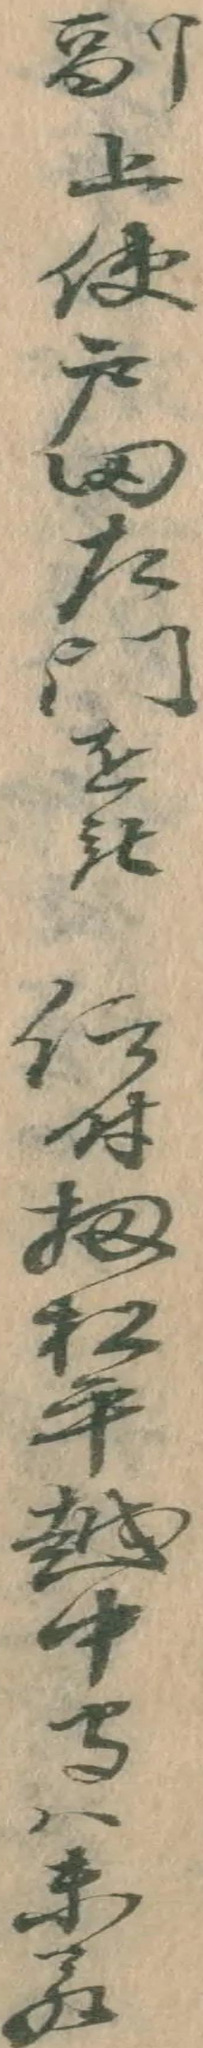副上使戸田左門を被仰付扨松平越中守は未若
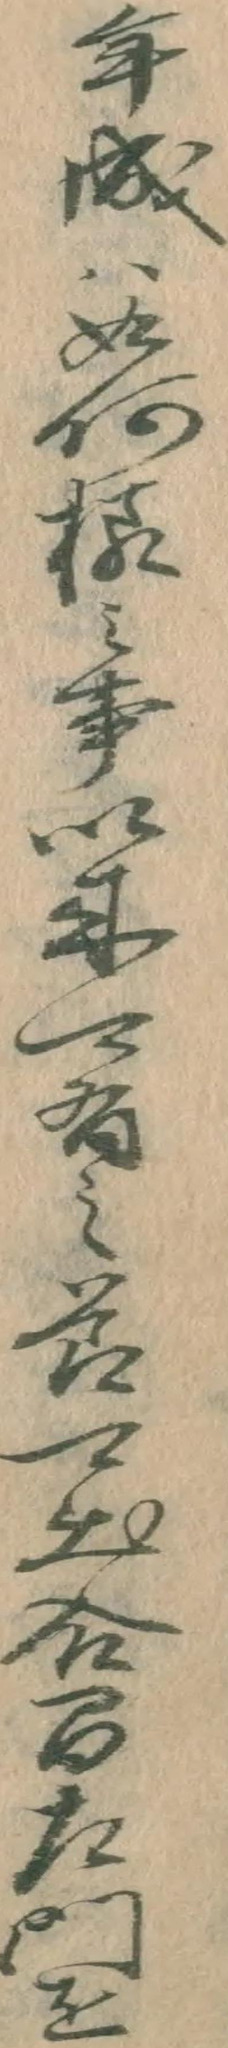年成は如何様之事以来可有之節可出合間左門を
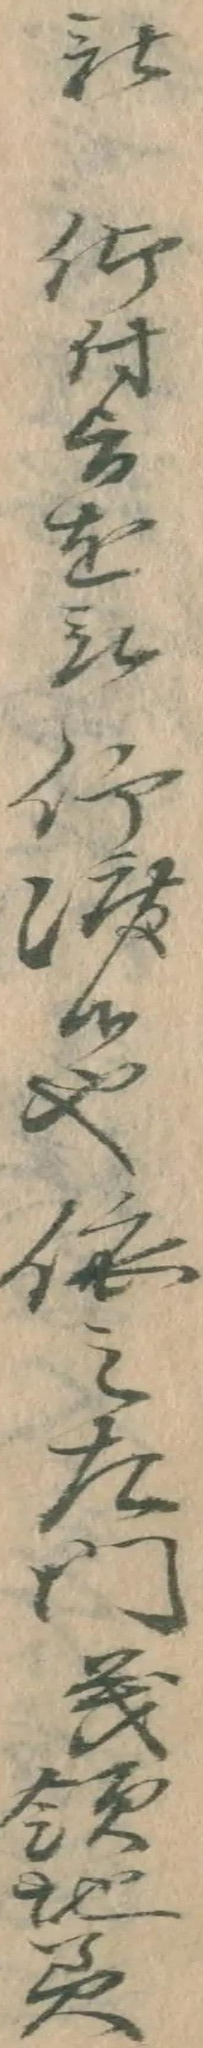被仰付旨を被仰渡候也依之左門義領地美
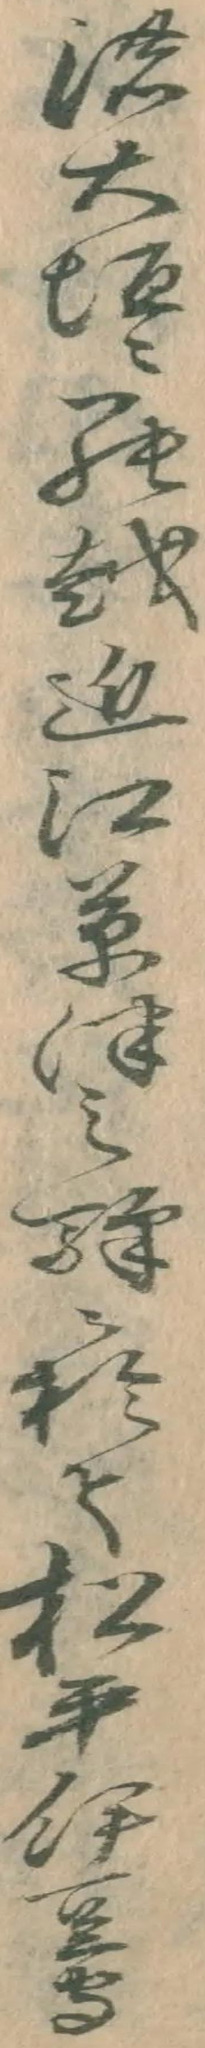濃大垣に罷越近江草津之駅に於て松平伊豆守
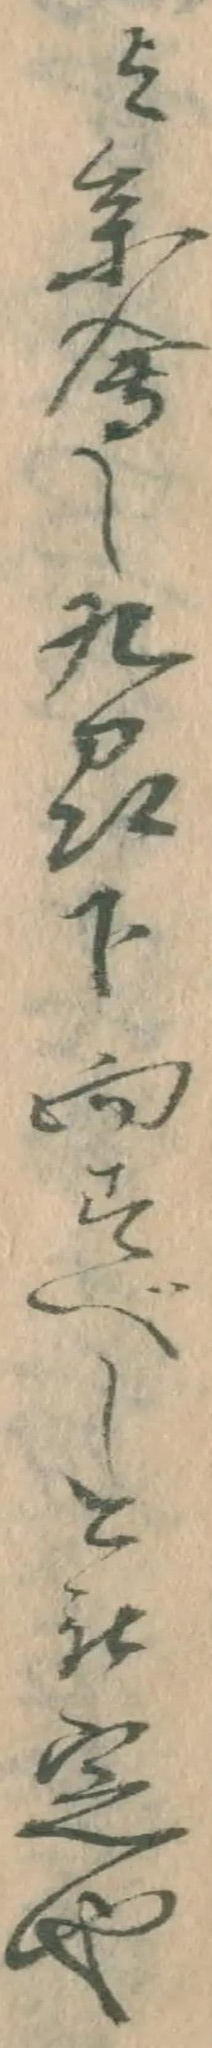と参会し九州下向すべしと被定也

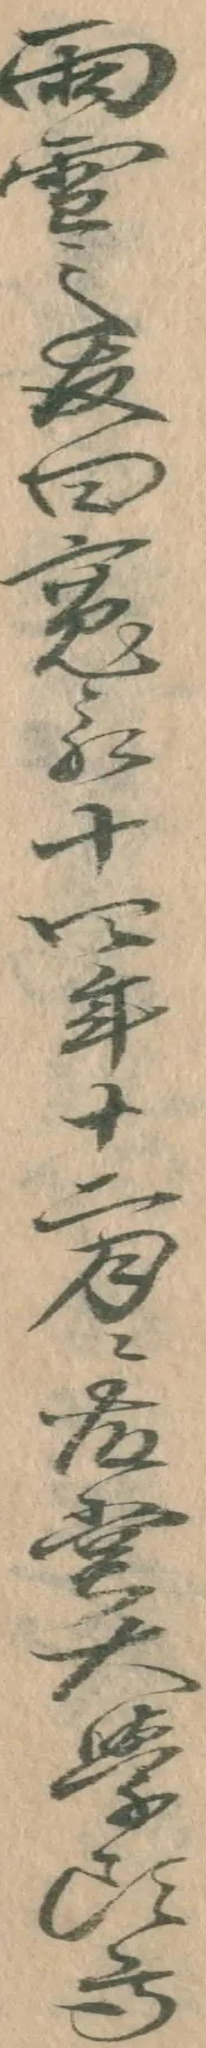雨雪之友曰寛永十四年十二月に藤堂大学頭高
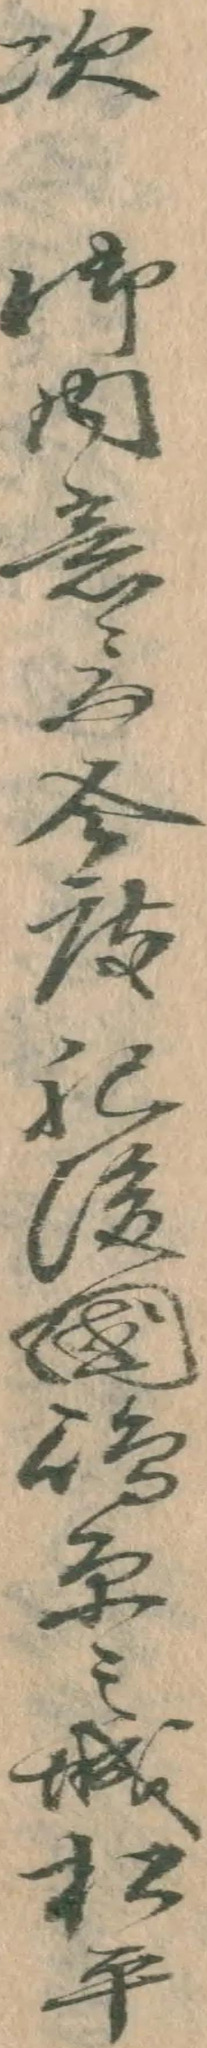次御内意に而今度肥後国島原之城松平
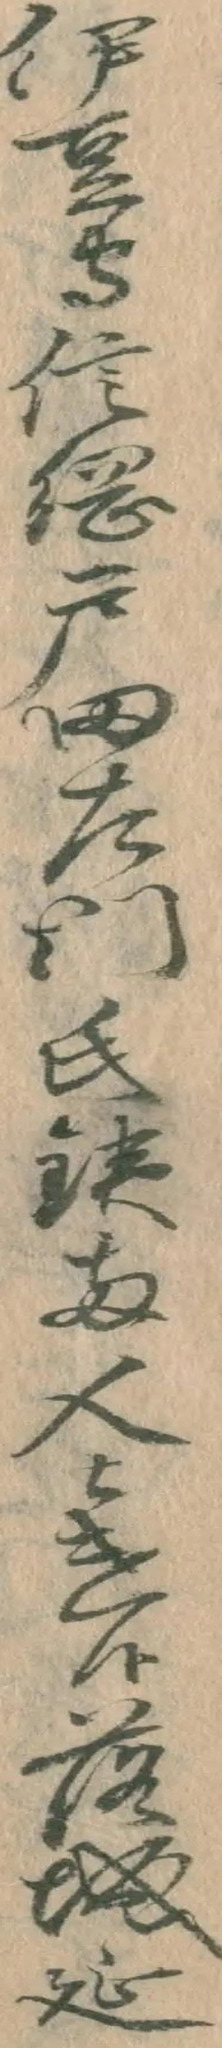伊豆守信綱戸田左門氏鉄両人被遣候落城延
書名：切支丹御退治記 49巻. [3]
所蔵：国立国会図書館 National Diet Library, JAPAN
